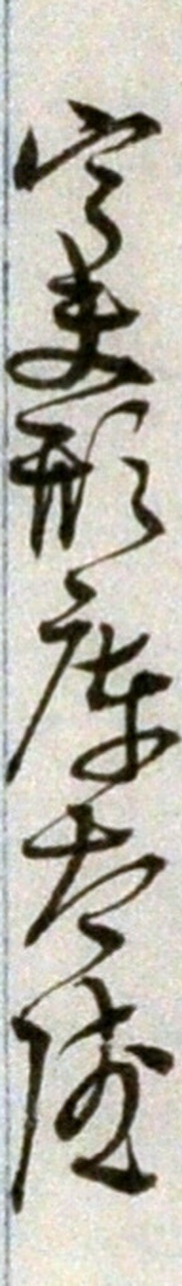宇夫形庫太殿
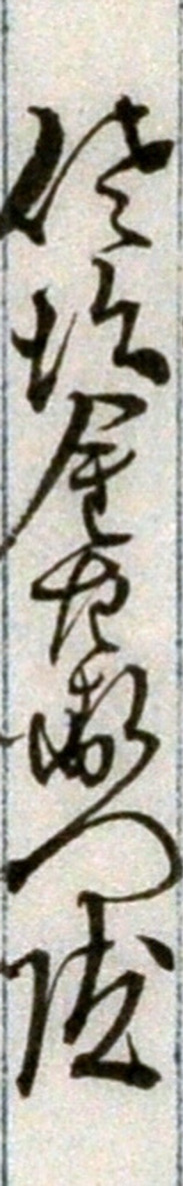佐治金左衛門殿
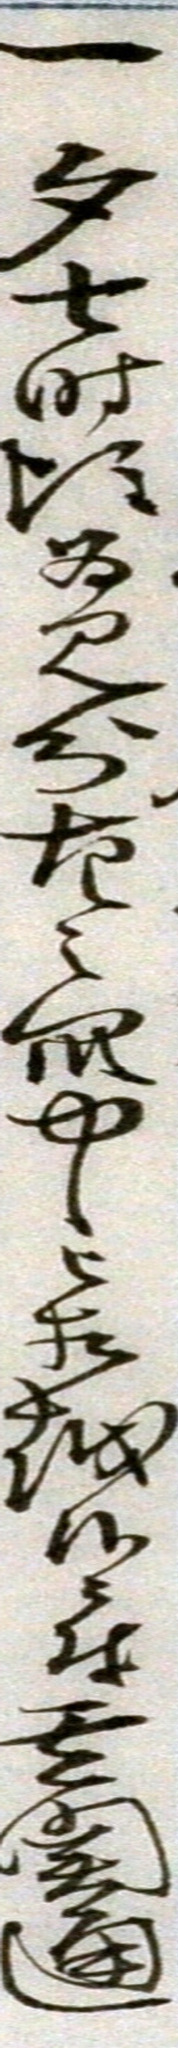一夕七時頃為見分左之衆中被相越候ニ付玄関通
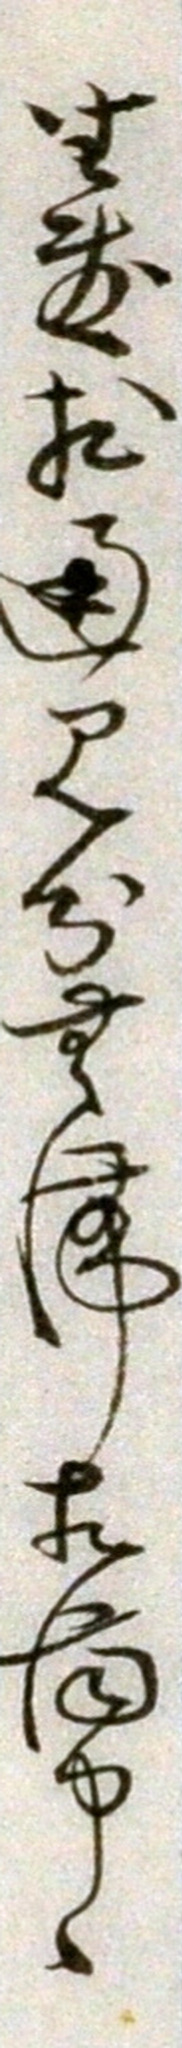座敷へ相通見分無滞相済申候
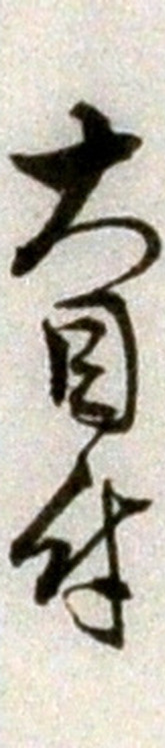大目付
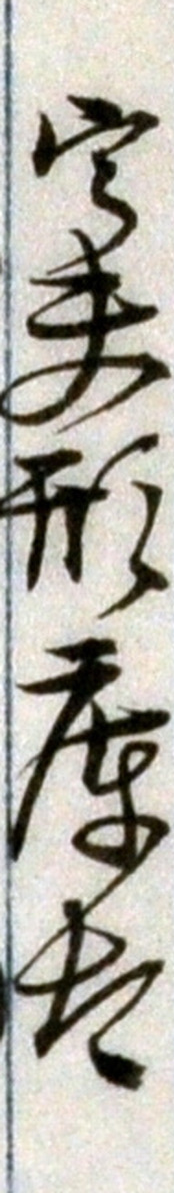宇夫形庫太
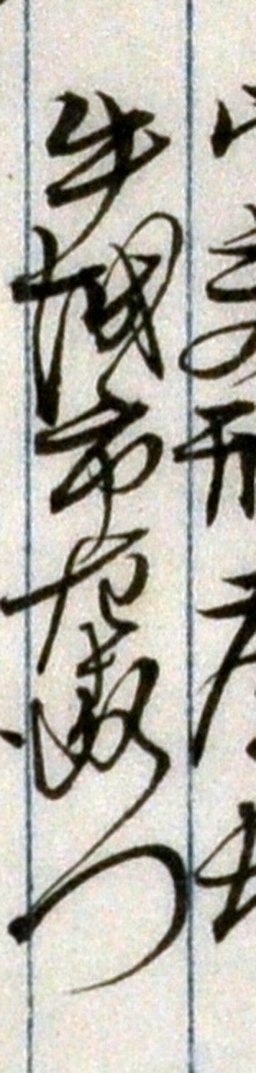牛越市左衛門
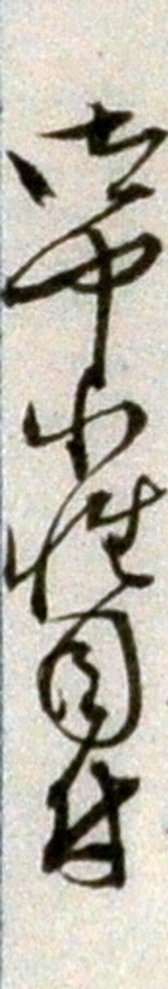御中小性目付
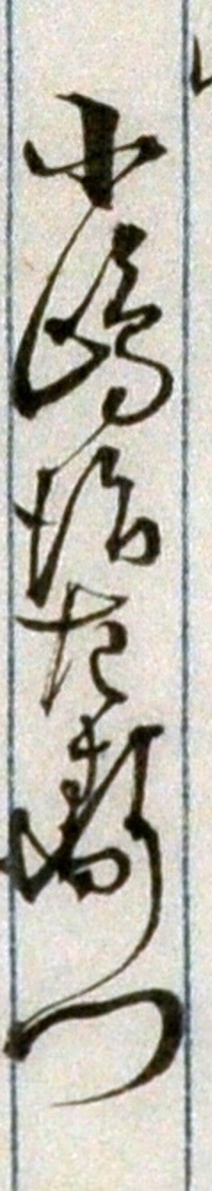小島治左衛門
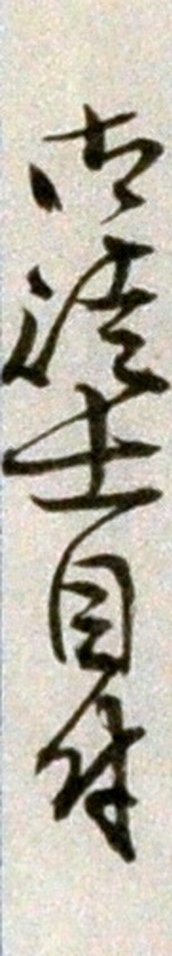御徒士目付
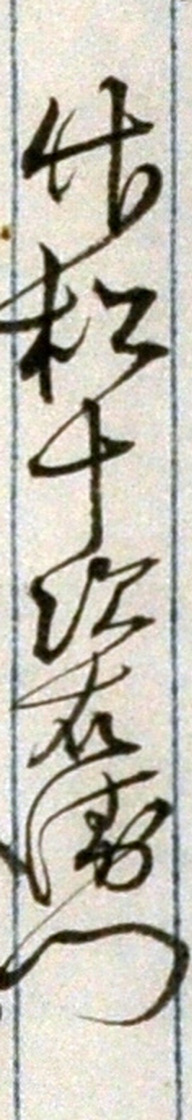竹松十次右衛門
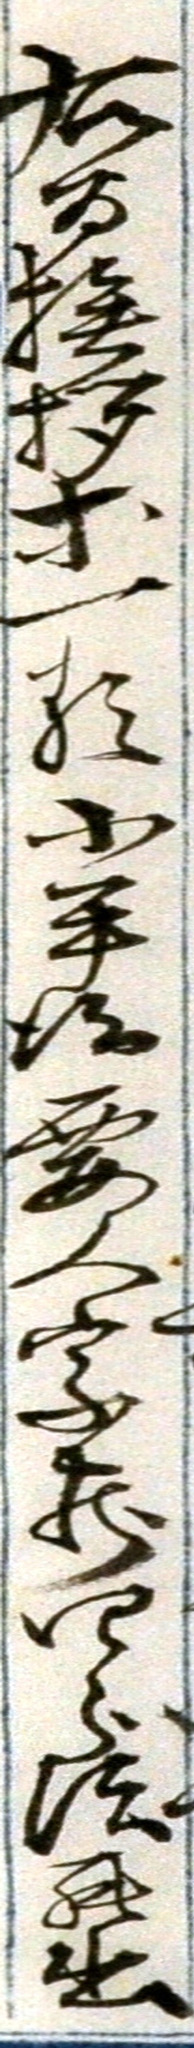右為挨拶抔一類小平治要人宗蔵四郎治罷出

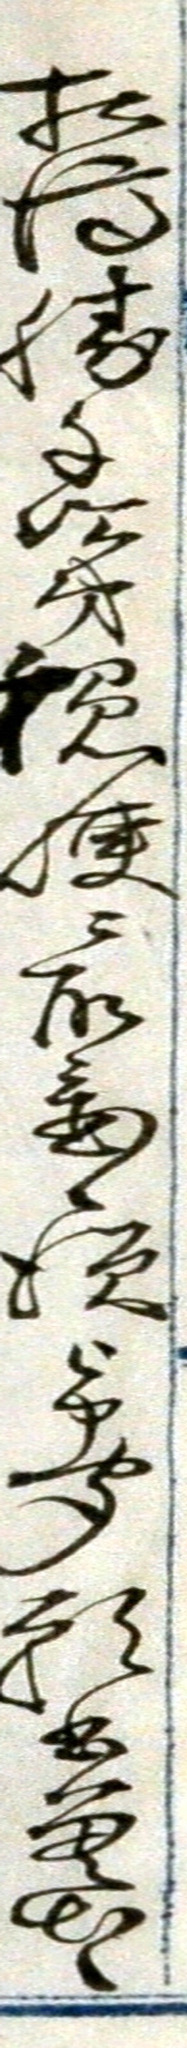相済勝手次第穏便ニ取置候様被申聞願書差出候
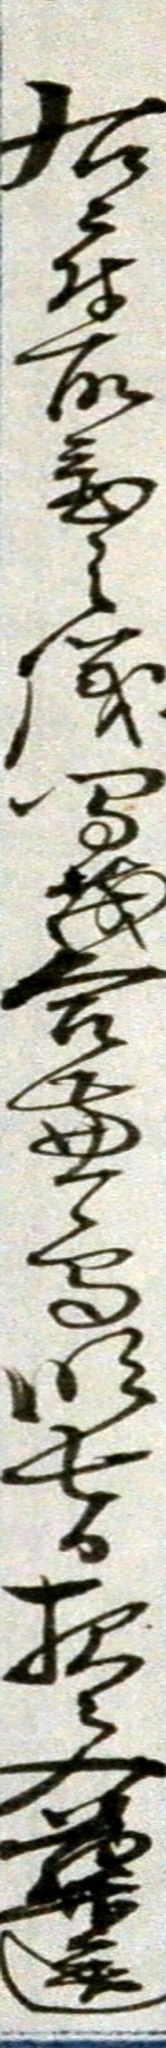一右ニ付取置之儀間茂合兼候間明七日夜ニ入葬送
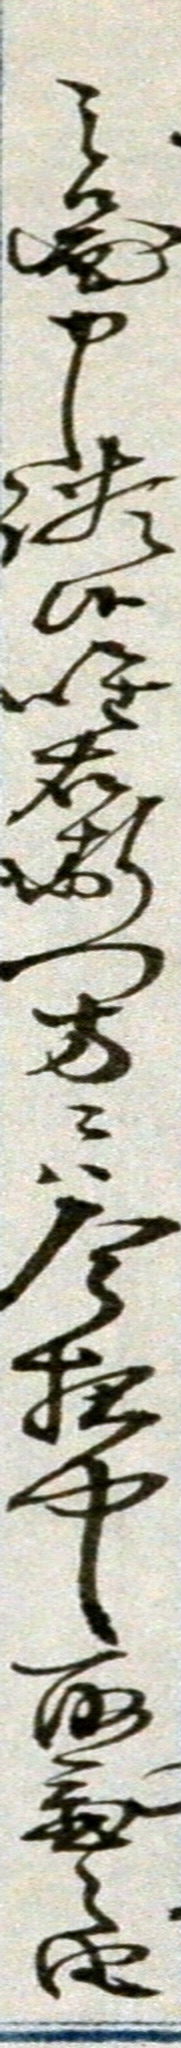之図申談候唯右衛門方ニハ今夜中取置之由
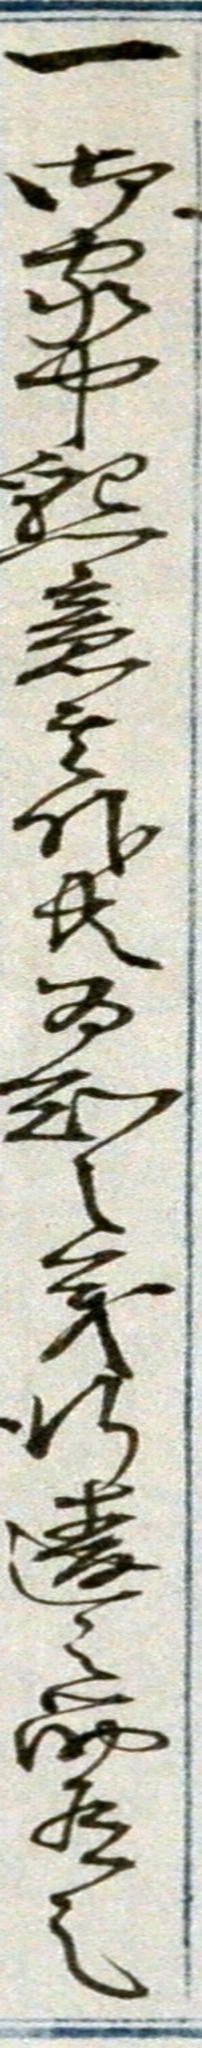一御家中懇意其外共為知之儀行違之筋有之
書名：川面小藤太子細有之多賀谷唯右衛門ヲ打果候一件
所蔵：伊那市立高遠町図書館・合同会社AMANE
